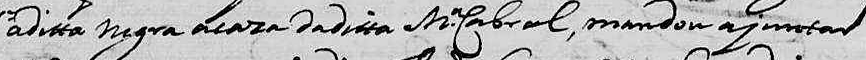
a ditta negra a caza da ditta M.a Cabral, mandou ajuntar
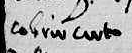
cobrio certo
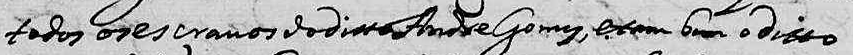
todos os escrauos do ditto Andre Gomes, e tambem o ditto
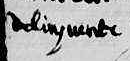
delinquente
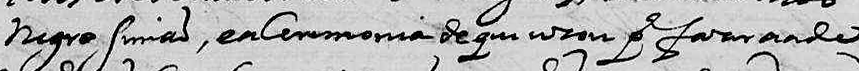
negro simaõ, e a Ceremonia de que uzou pa fazer a ade
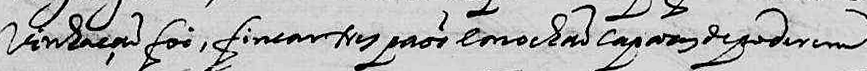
vinhaçaõ foi, fincar tres paōs em o chaõ capazes de poderem
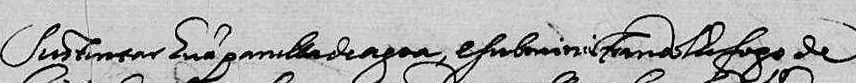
Sustentar huā panella de agoa, e subministrandolhe fogo de
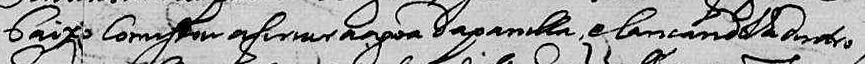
baixo comessou a feruer a agoa da panella, e lançandolhe dentro
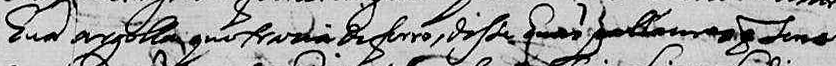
huā argolla que trazia de ferro, disse huas̄ pallauras q̄ se nā
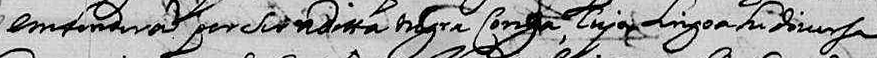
emtenderaõ por ser a ditta negra Conga, cuja Lingoa he diuersa
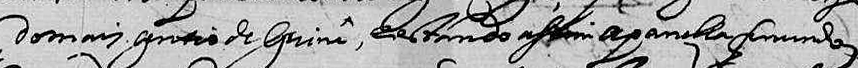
do mais gentio de Guinê, e estando assim a panella feruendo
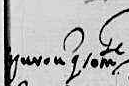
jurou q̄ somte
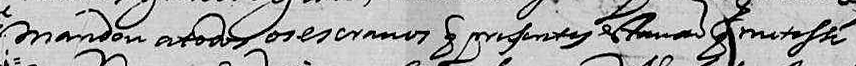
mandou a todos os escrauos q̄ presentes estauaõ metessē
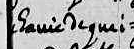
hauia de quei
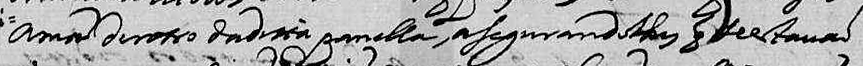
a maõ dentro da ditta panella, asegurandolhes q̄ se estauaõ
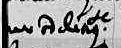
o delinq.te
